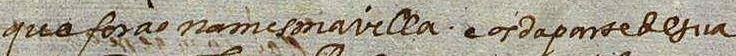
que foraõ na mesma villa e os da parte de sua
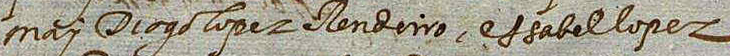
may Diogo lopez Rendeiro, e Jsabel lopez
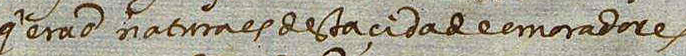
q̄ eraõ naturaes desta çidade e moradores
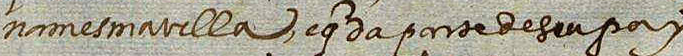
na mesma villa, e q̄ da parte de seu pay
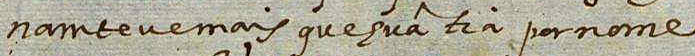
nam teue mais que huā tia por nome
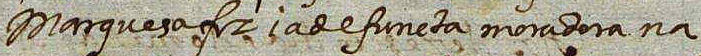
Marquesa frz̄ ia defuncta moradora na
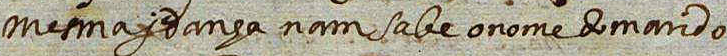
mesma jdanha nam sabe o nome do marido
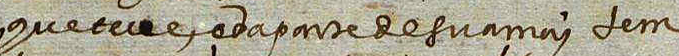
que teue, e da parte de sua may tem
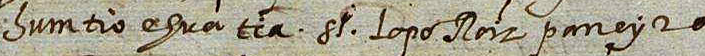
hum tio e huā tia. ss. Lopo Roīz paneyro
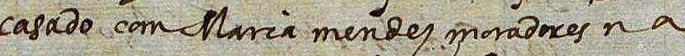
casado com Maria mendez moradores na
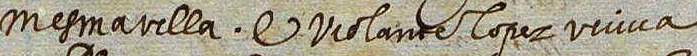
mesma villa. E Violante Lopez viuua
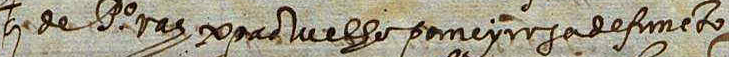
de P.o vaz xpaõ uelho paneyro ja defuncto
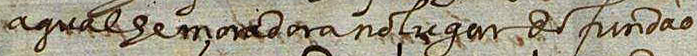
a qual he moradora no Lugar do Fundaõ.
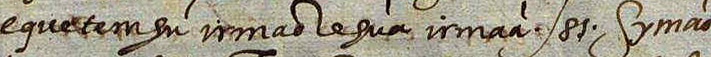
e que tem hū irmaõ e huā irmaã. ss. Symaõ
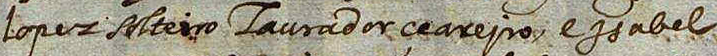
Lopez solteiro Laurador çearejro, e jsabel
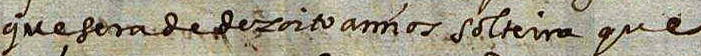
que sera de dezoito annos solteira que
